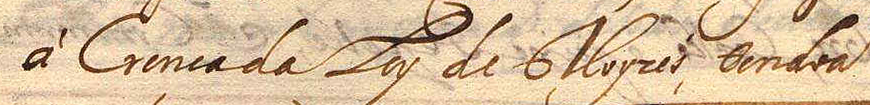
à Crença da Ley de Moyzés, tendoa
